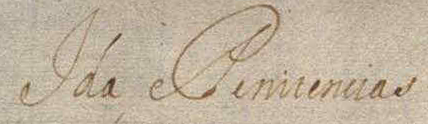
Ida e Penitencias
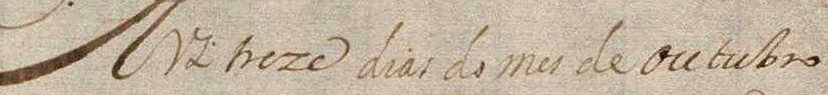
Aoz treze dias do mes de outubro
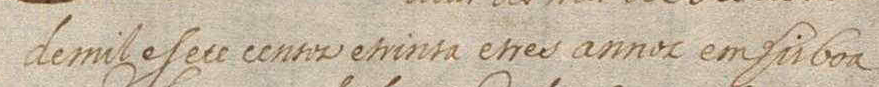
de mil e setecentos e trinta e tres annoz em Lisboa
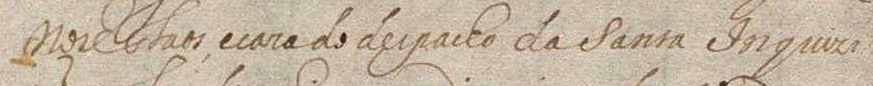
nos estaos, e caza do despacho da Santa Inquizi
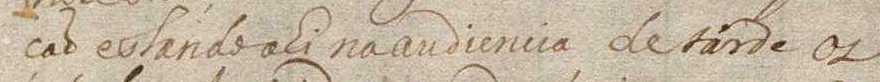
çaõ estando ahi na audiencia de tarde os
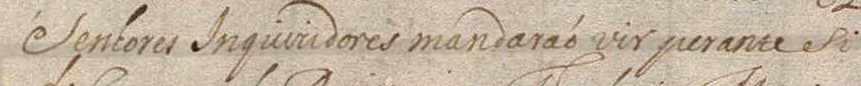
Senhores Inquizidores mandaraõ vir perante Si
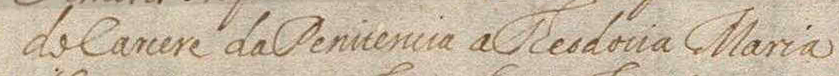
do Carcere da Penitencia a Theodocia Maria
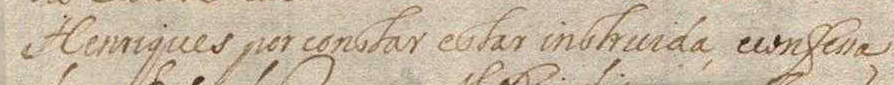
Henriques por constar estar instruida, e confessa
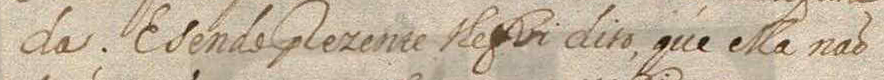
da; E sendo pRezente lhe foi dito, que ella naõ
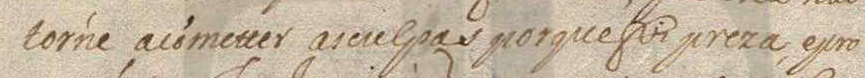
torne a cōmetter as culpas porque foi preza, e pro
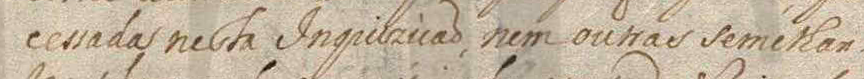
cessada nesta Inquiziçaõ, nem outras semelhan
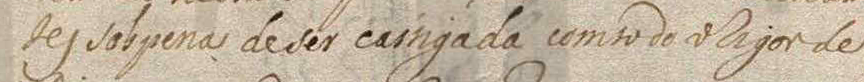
tes sob pena de ser castigada com todo o Rigor de
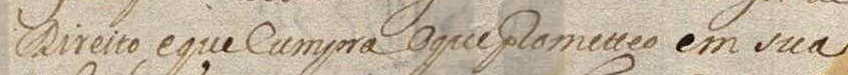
Direito, e que Cumpra o que pRometteo em sua
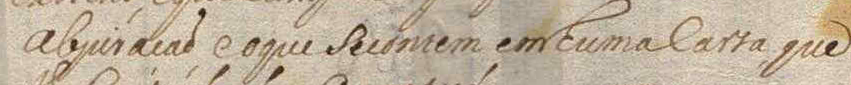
abjuraçaõ, e o que se contem em huma Carta, que
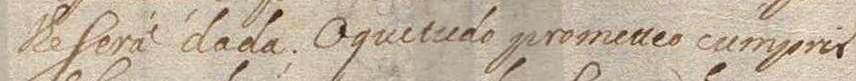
lhe será dada. O que tudo prometteo cumprir
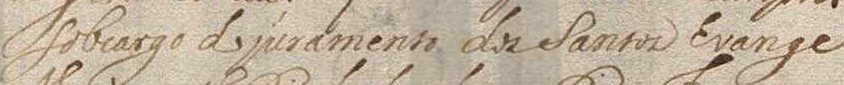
sob cargo do juramento dos Santos Evange
